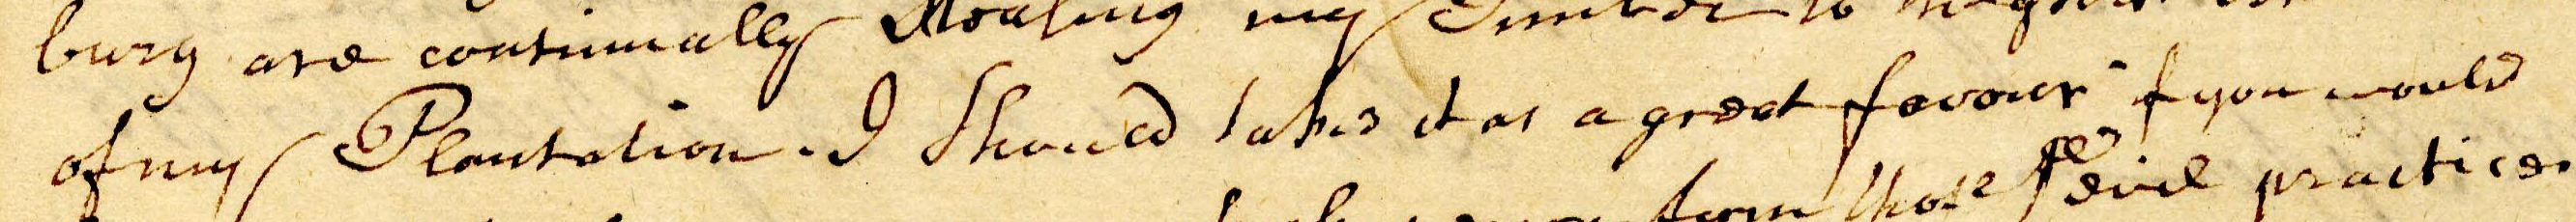of my Plantation. I Should taked it as a great favour if you yould
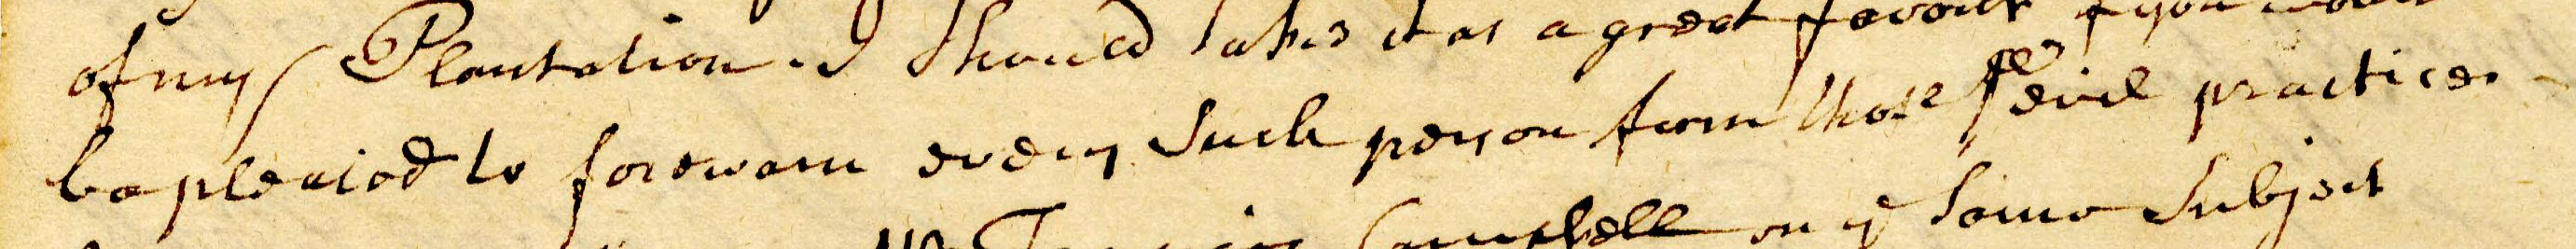be {pleased} to forewarn every such person form those evil practices
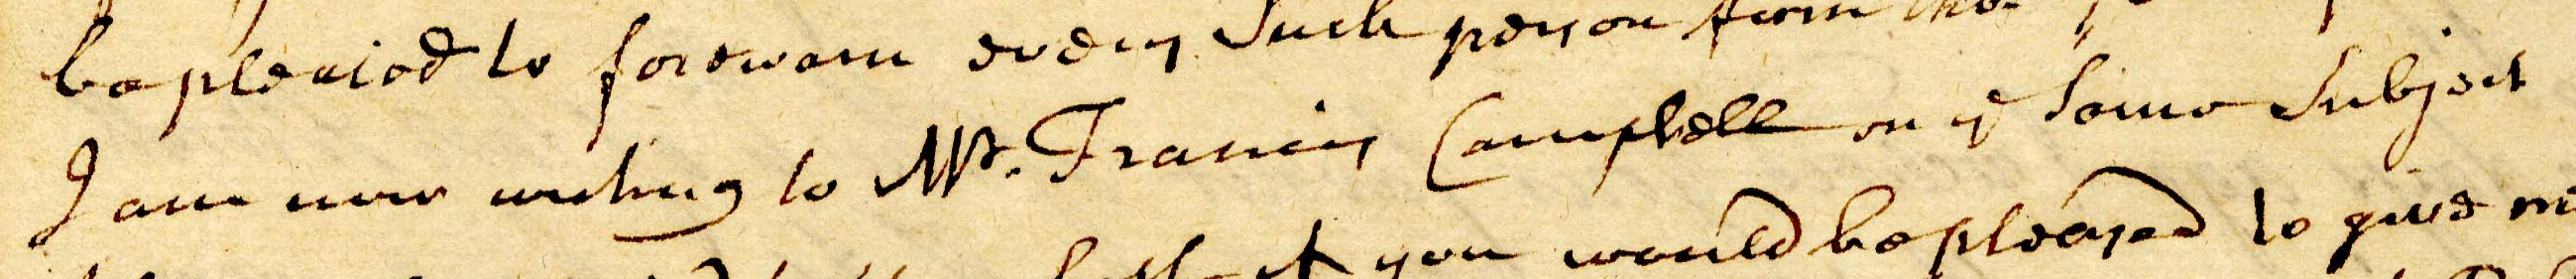I am now writing to M^r. Francis Campbell on y^e Same Subject
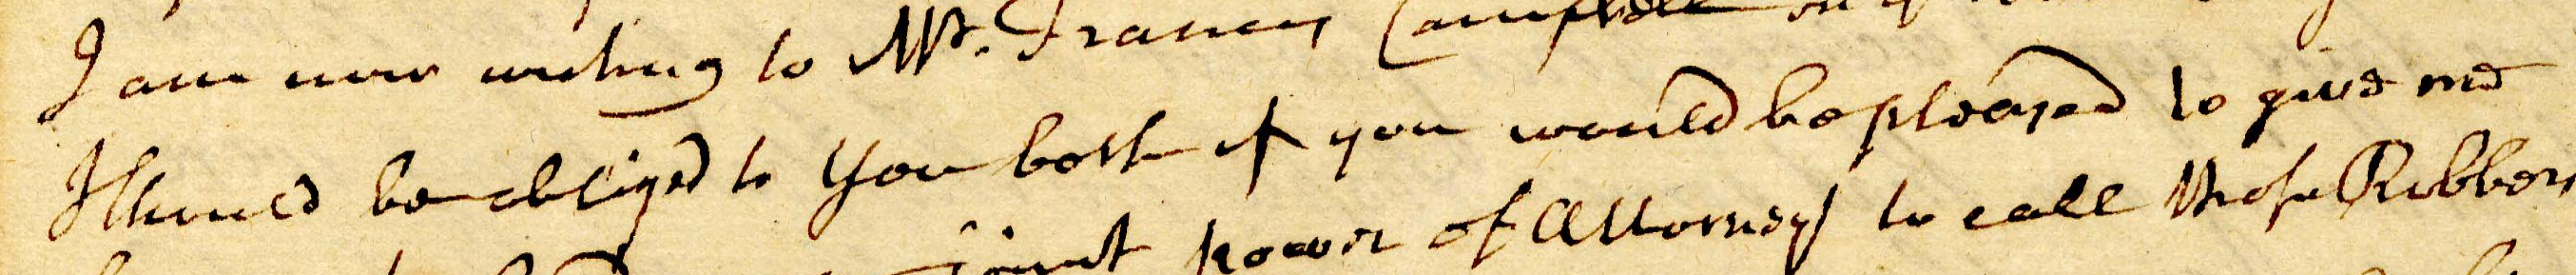I should be obliged to You both if you would be pleased to give me
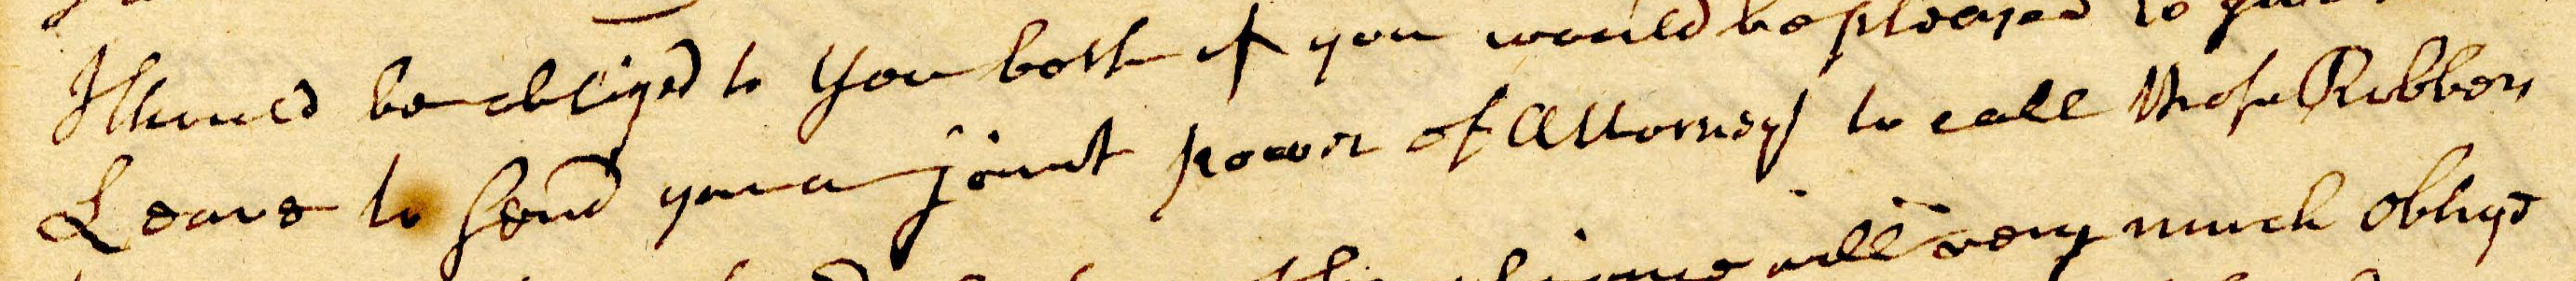Leave to Send you a joint power of Attorney to call those Robbers
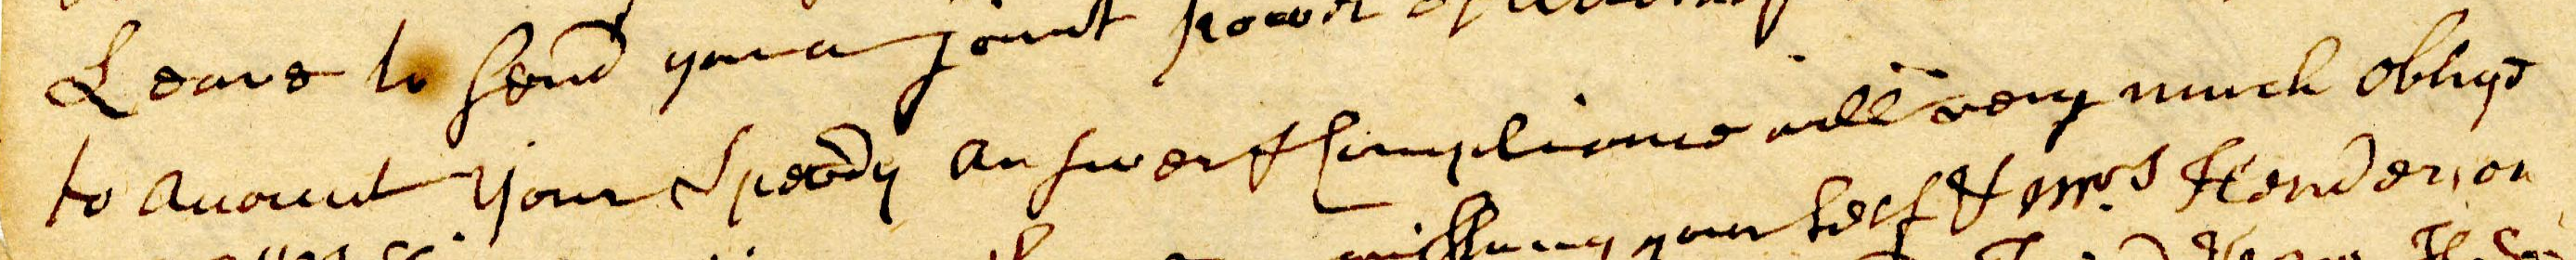to Account Your Speedy answer & Compliance will very much obligd
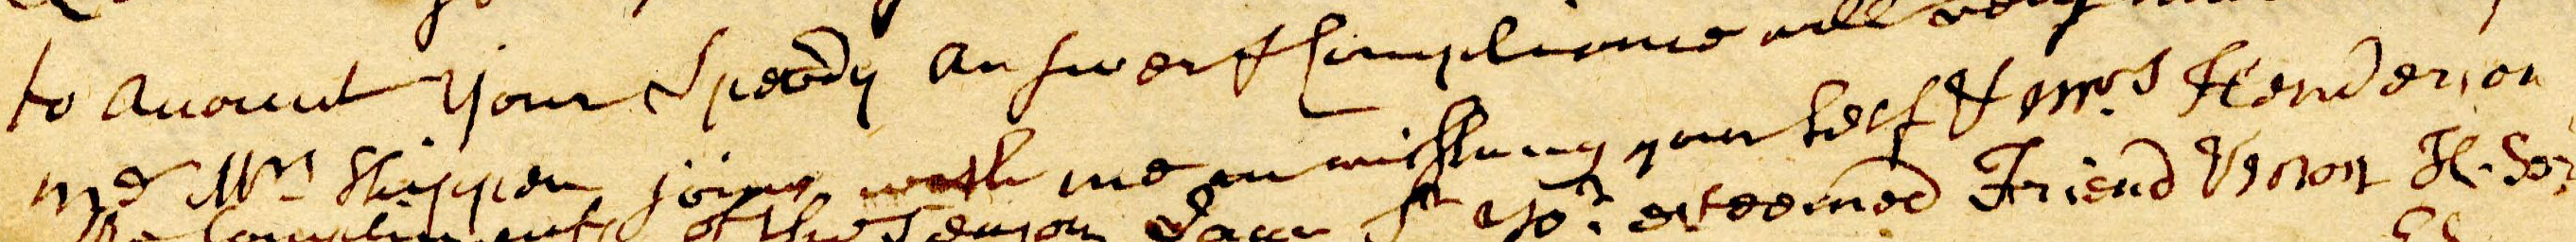Me M^rs Shippen joins with me in wishing your Self & M.^rs Henderson
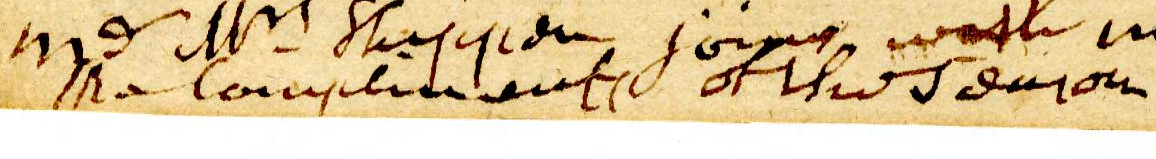the Compliments of the Season
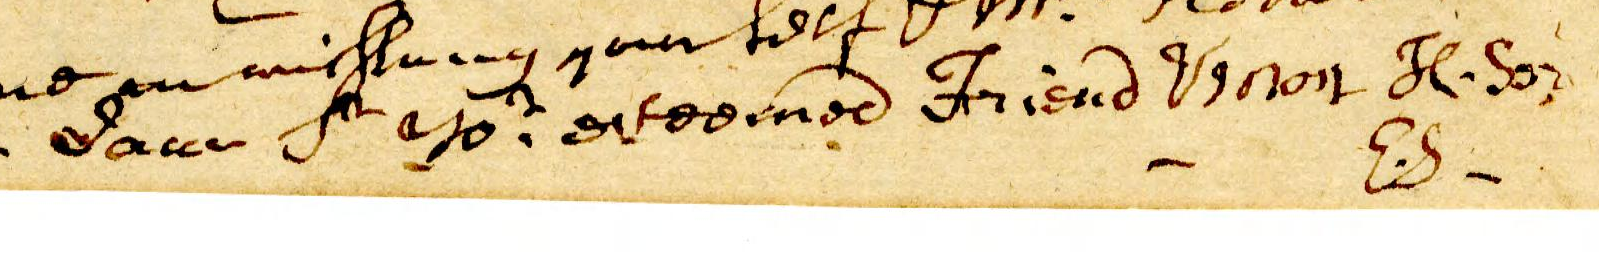I am yo^r esteemed Friend & Most H. Ser
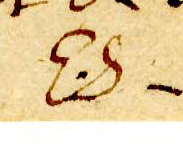E.S-
